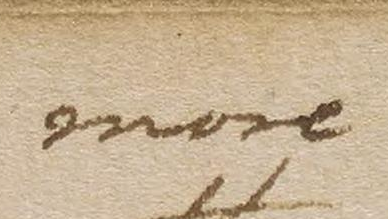more
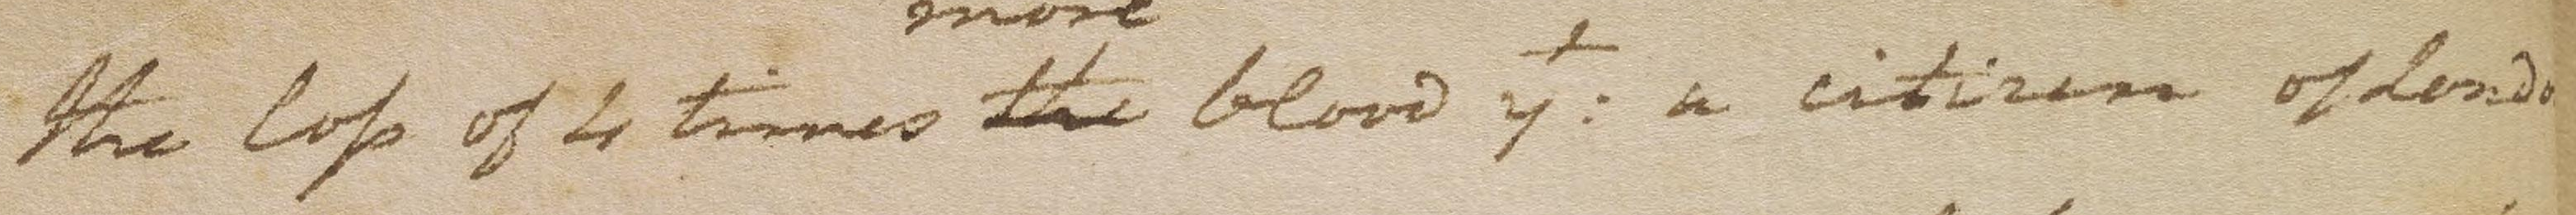the loss of 4 times [the] blood y^t: a citizen of London
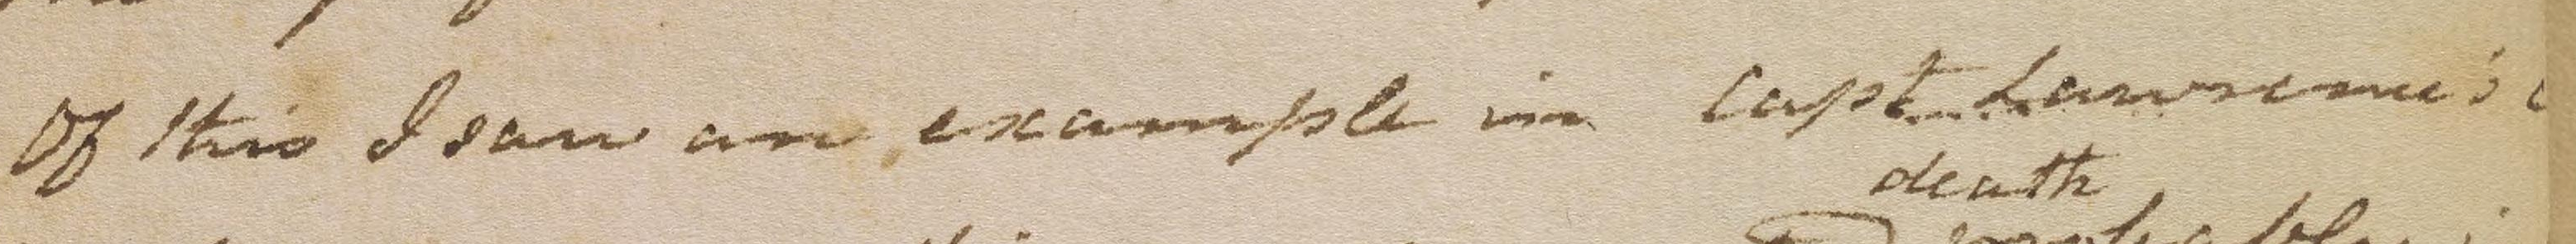of this I saw an example in Capt. Lawrence's
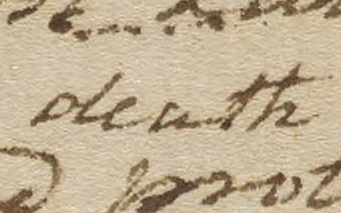death
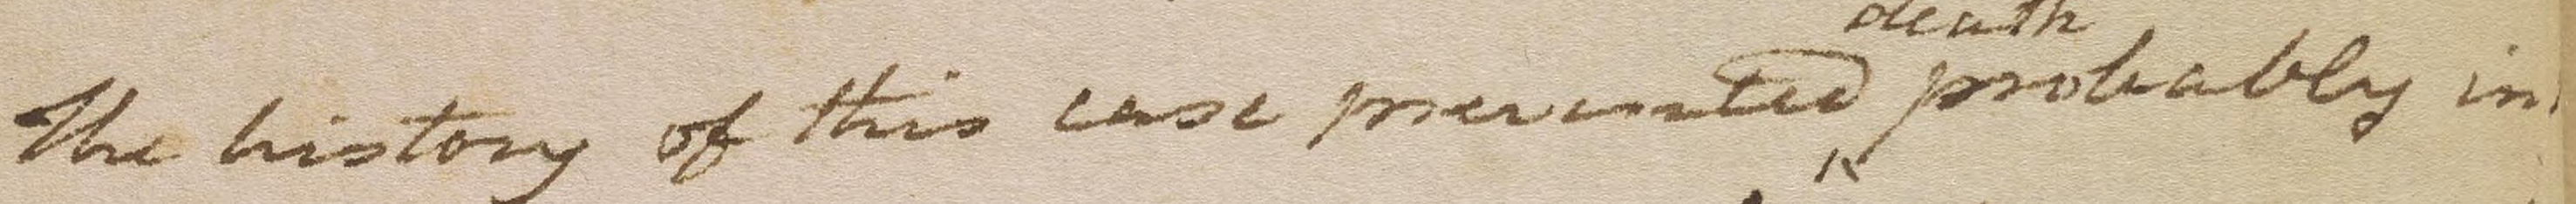The history of this case presented ^ probably in
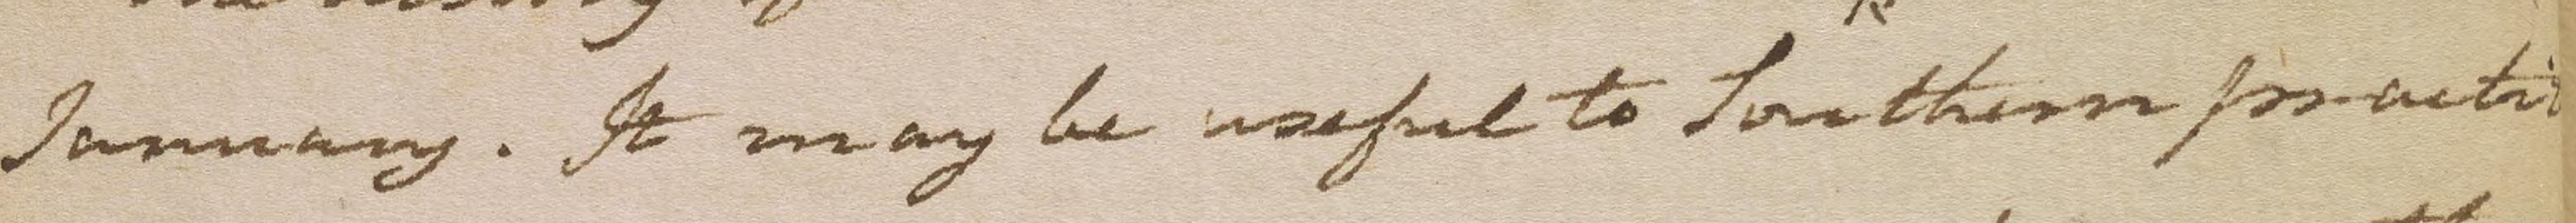January. It may be useful to Southern practi
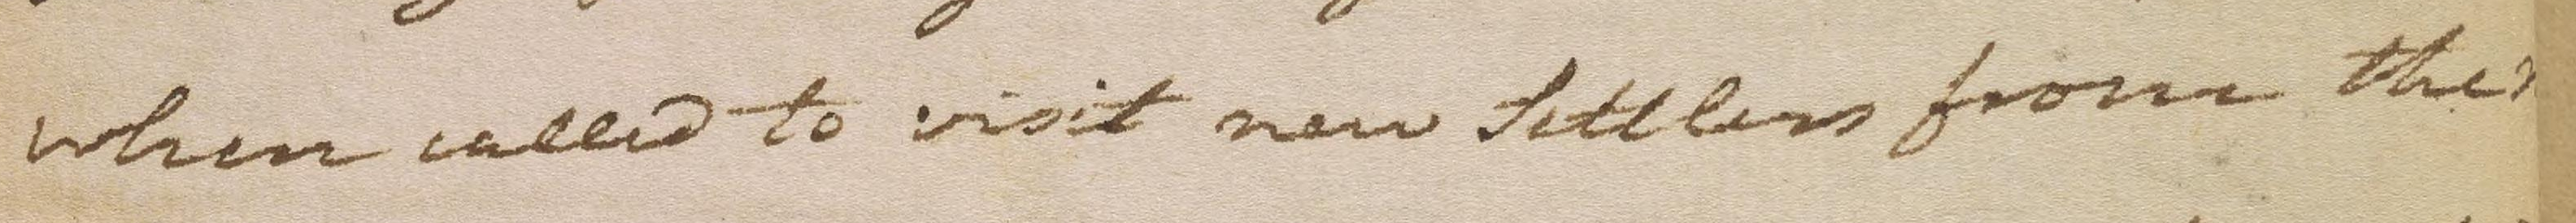when called to visit new settlers from the
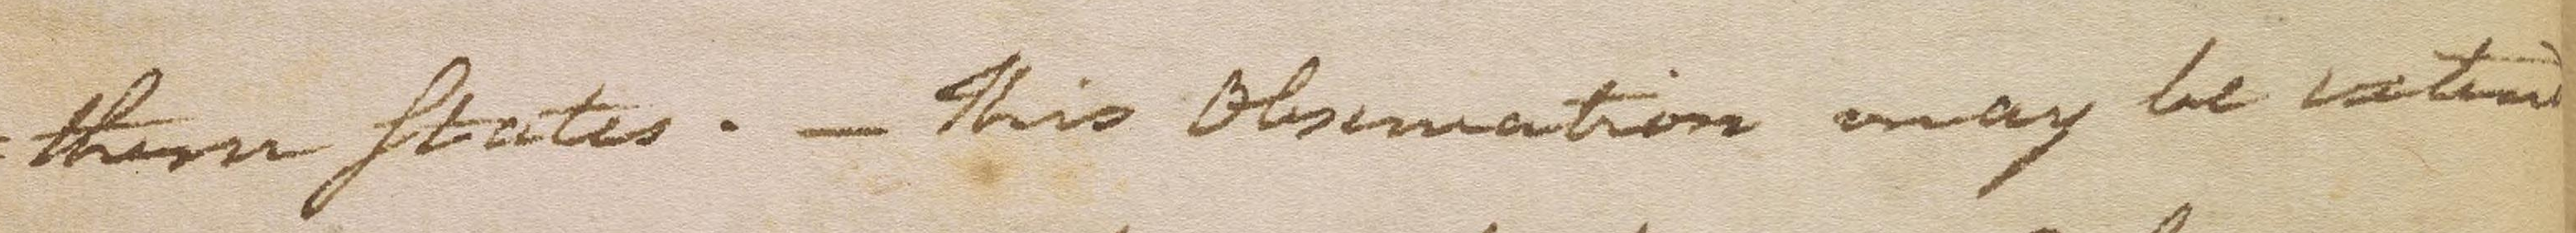-thern States.- This Observation may be extend
